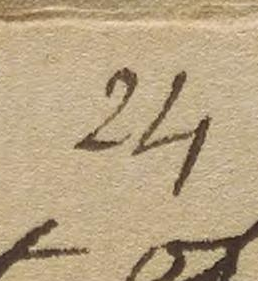24
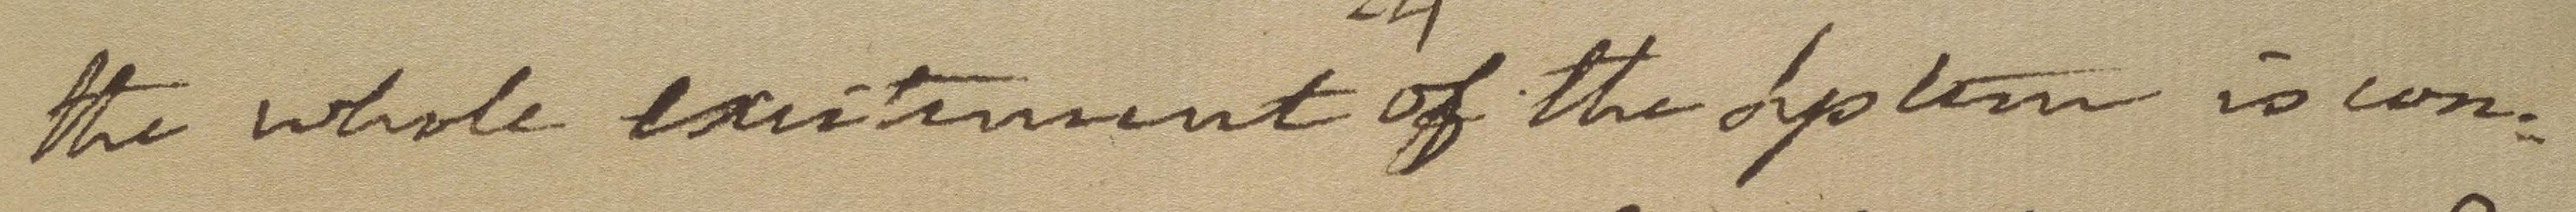the whole excitement of the system is con-
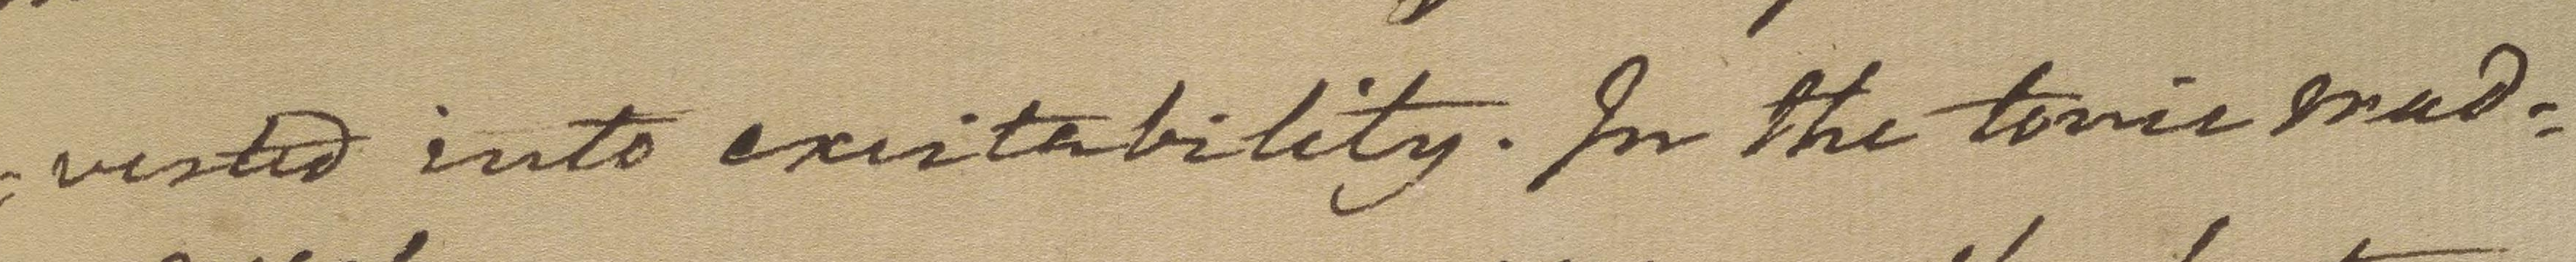-verted into excitability. In the torris mad-
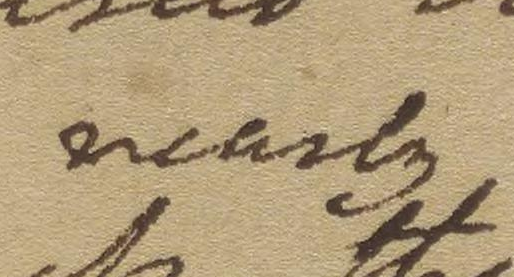nearly
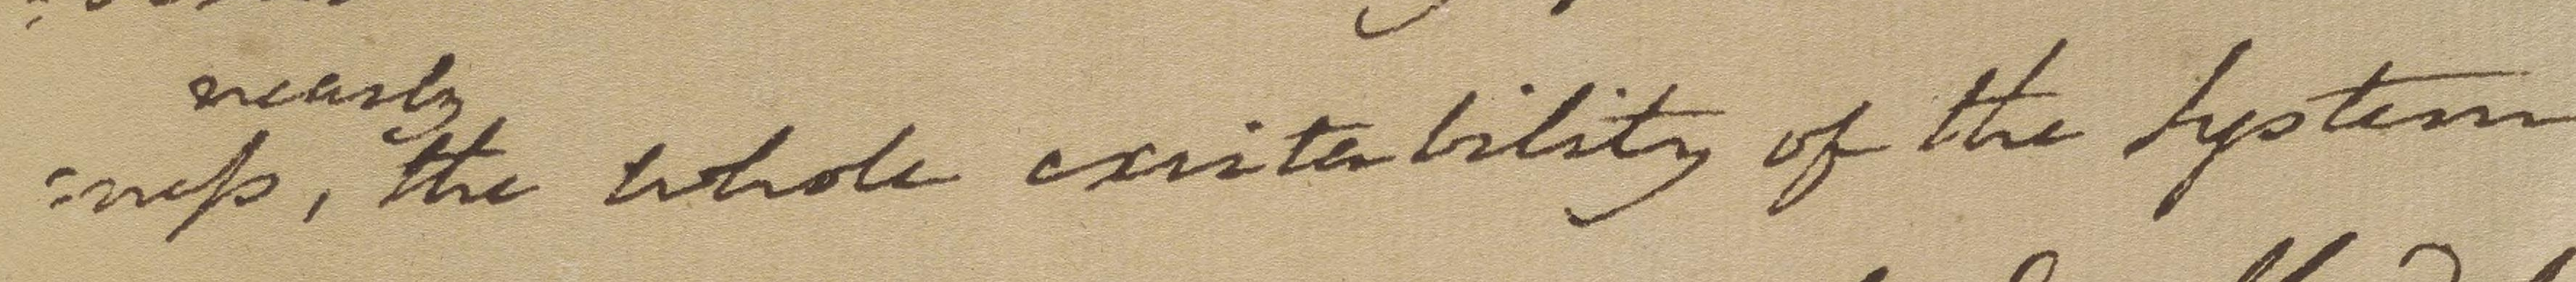-ness, the whole excitability of the System
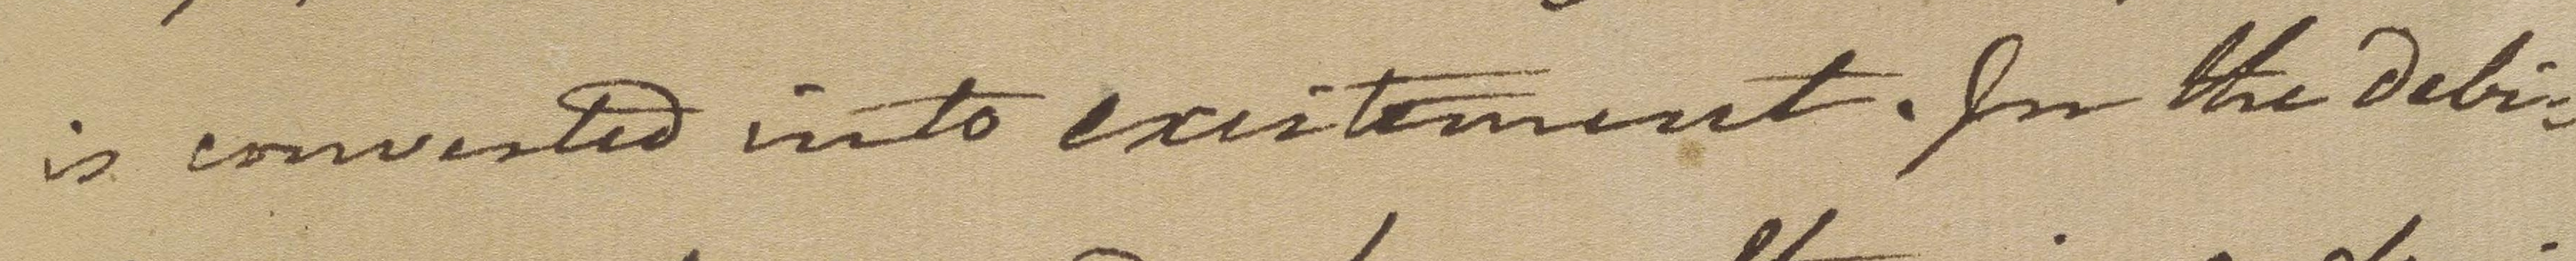is converted into excitement. In the debi-
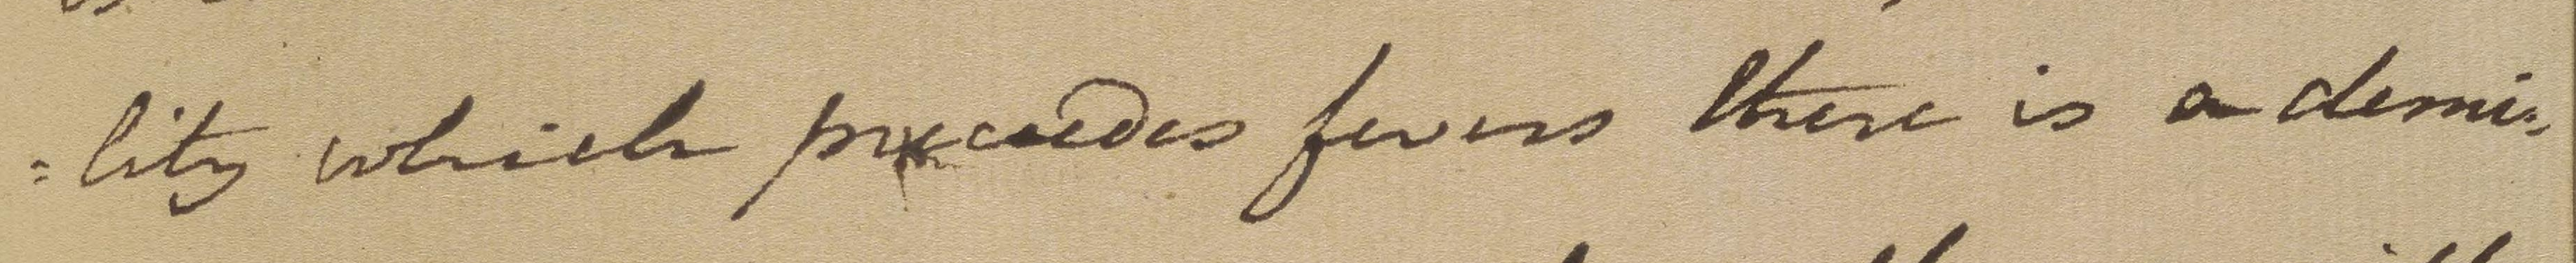-lity which precedes fevers there is a dimi-
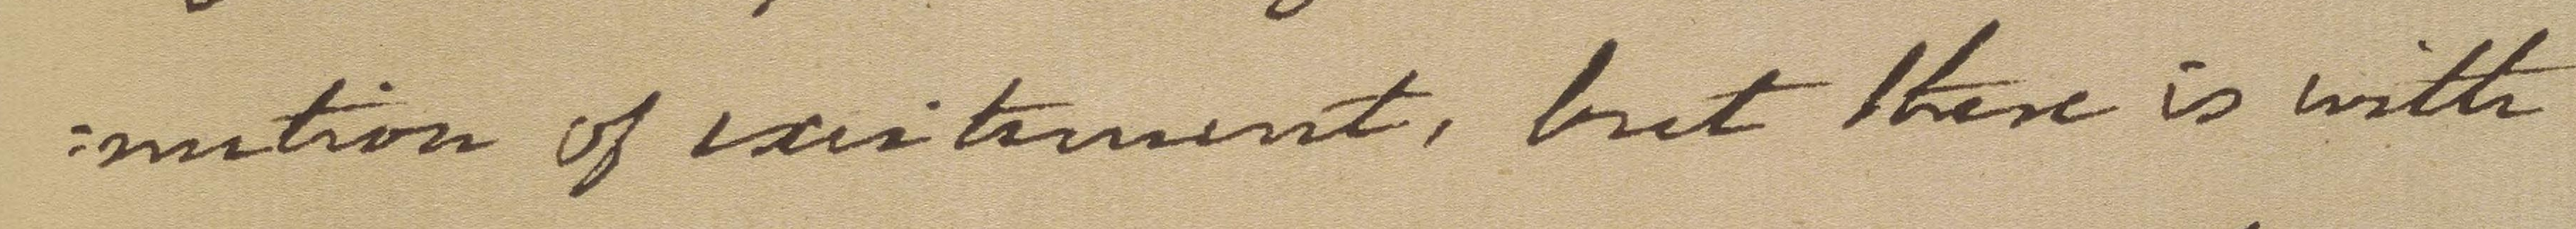-nuation of excitement, but there is with
